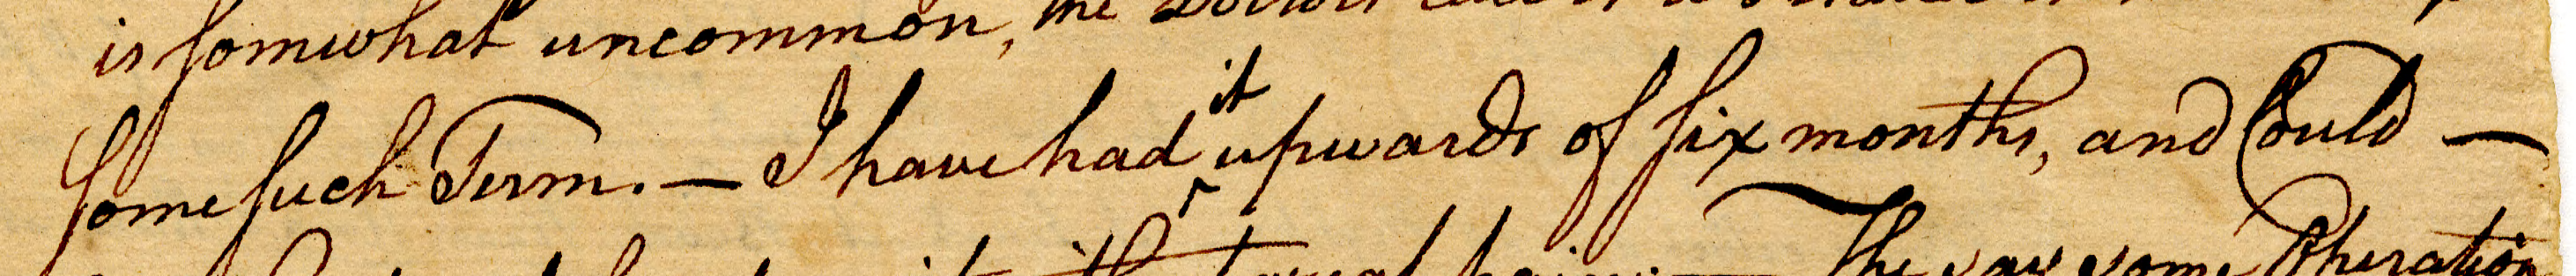some such Term.- I have had it upwards of six months, and Could-
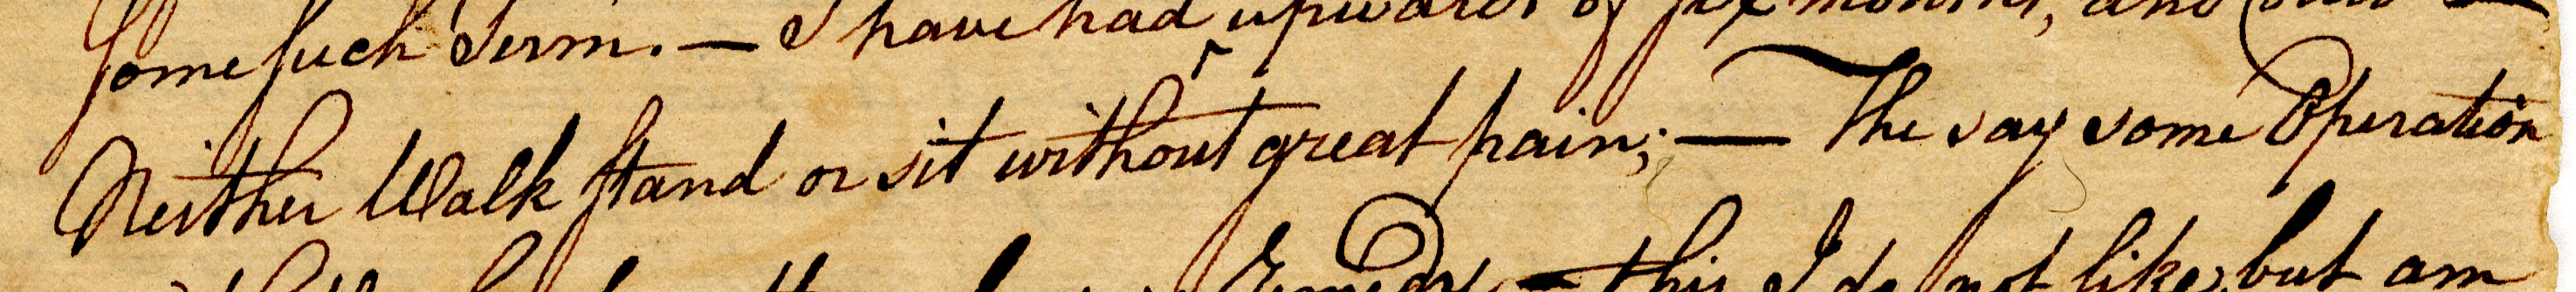neither walk stand or sit without great pain;- The say some operation
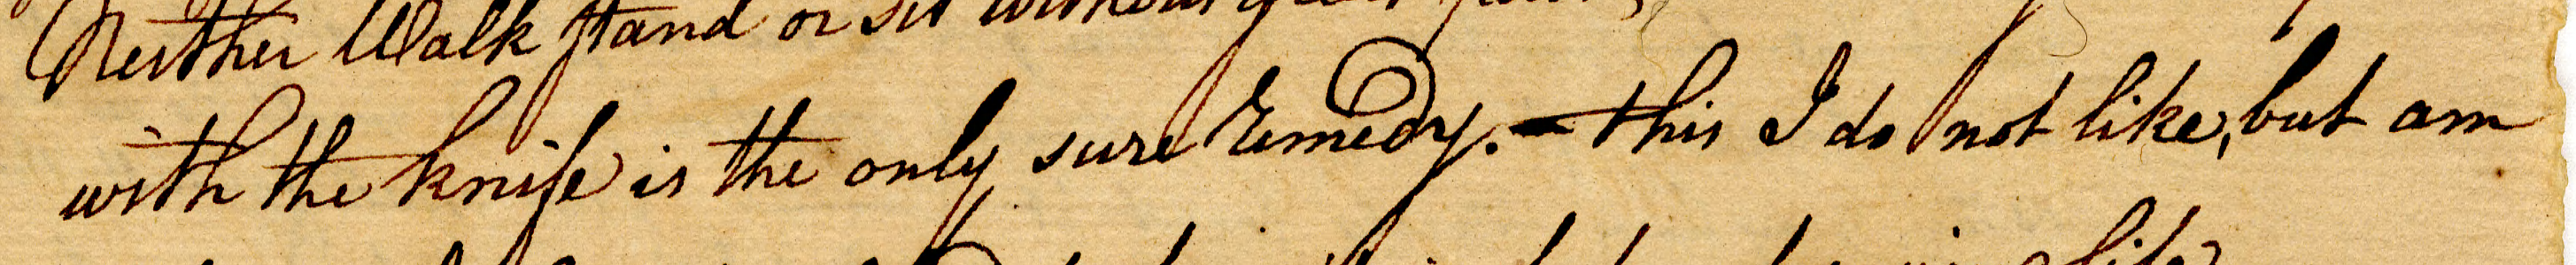with the knife is the only sure remedy.- This I do not like, but am
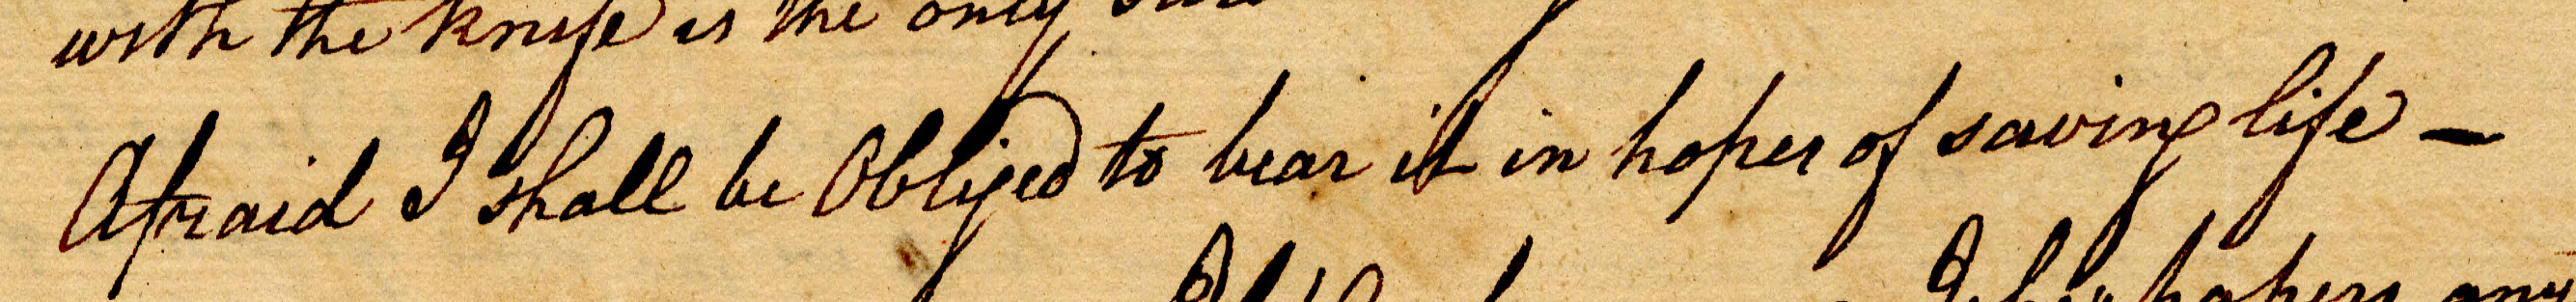Afraid I shall be obliged to bear it in hopes of saving life-
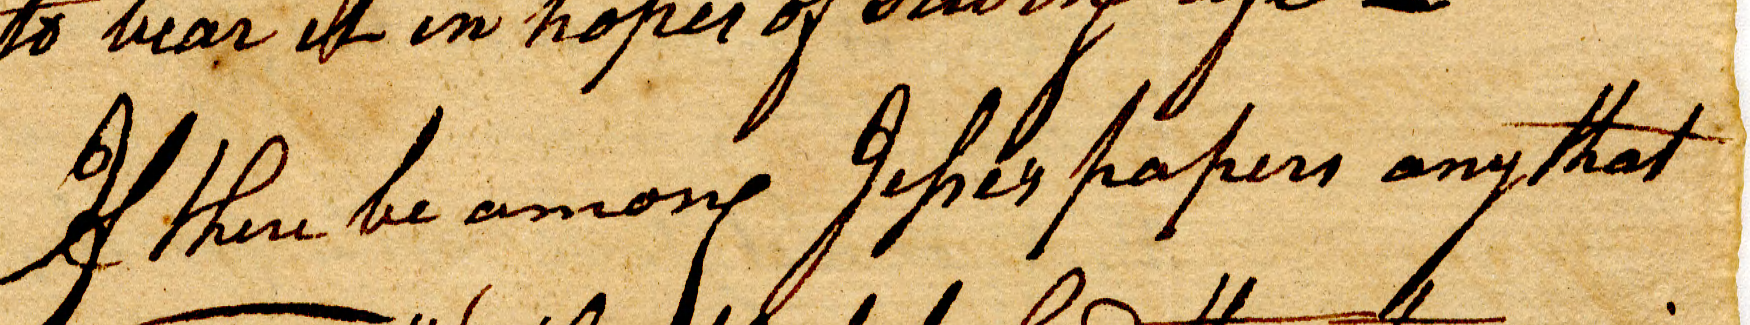If there be among Jesses papers any that
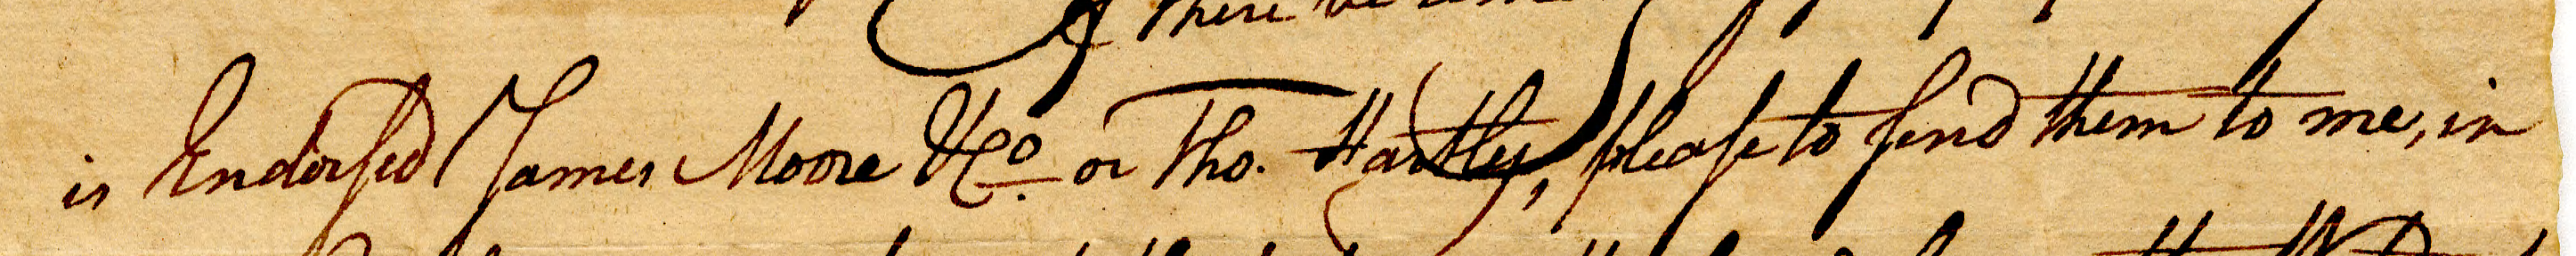is Endorsed James Moore &c^o. or Tho Hartley, please to send them to me, in
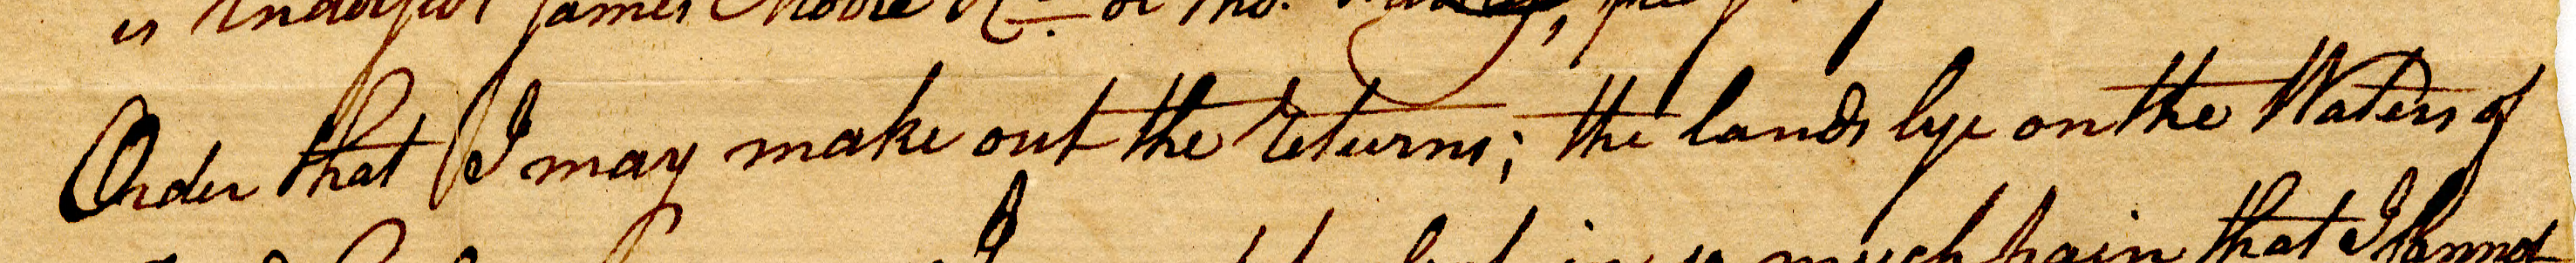Order that I may make out the returns; the lands lye on the Waters of
